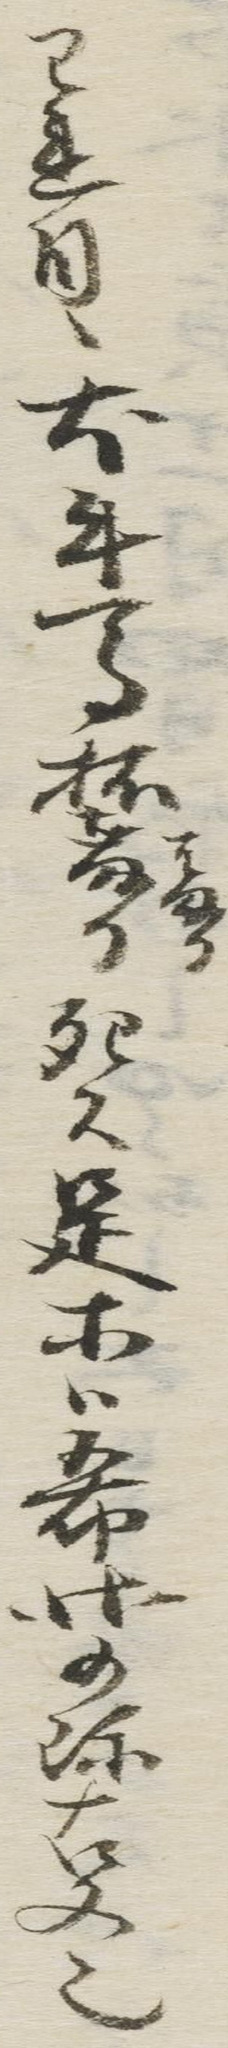われ目へ犬牛馬抔はまり死ス是等ハ希代の珍事也
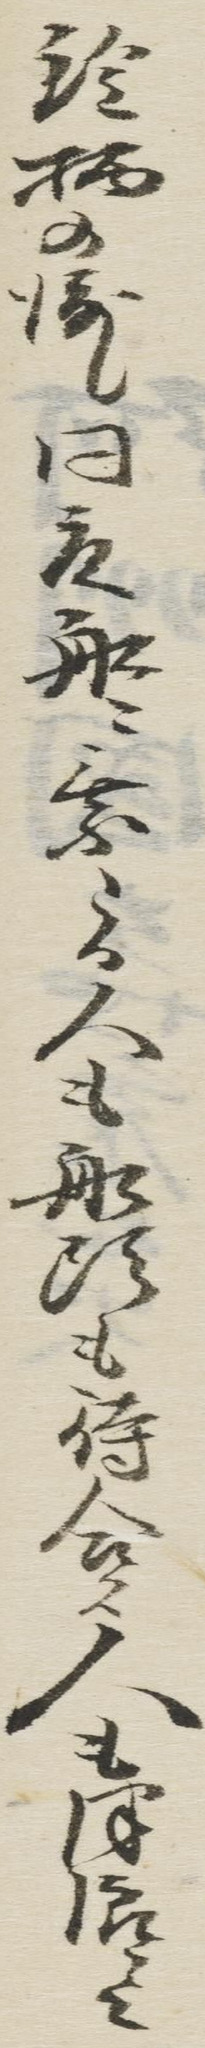鈴柄の渡し同夜船二乗たる人も船頭も待合ス人も津浪二て
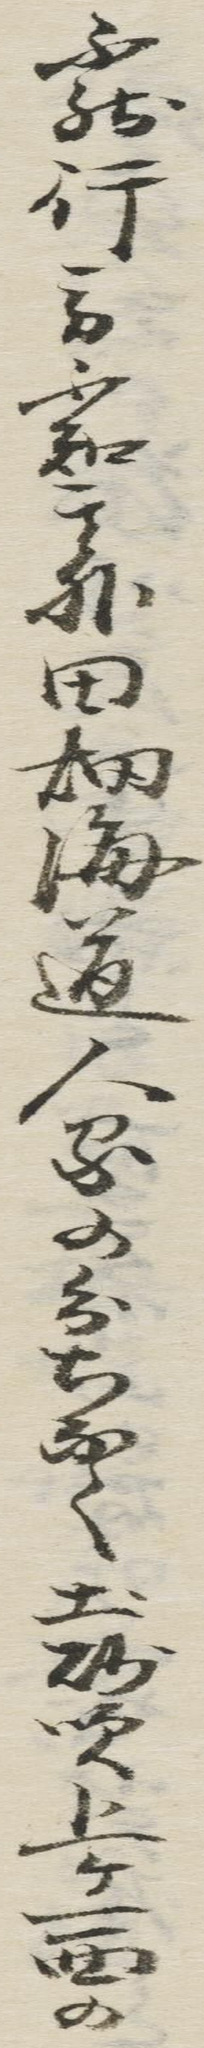不残行方不知其外田畑海道人家の分ちな〳〵土砂吹上ケ一西の
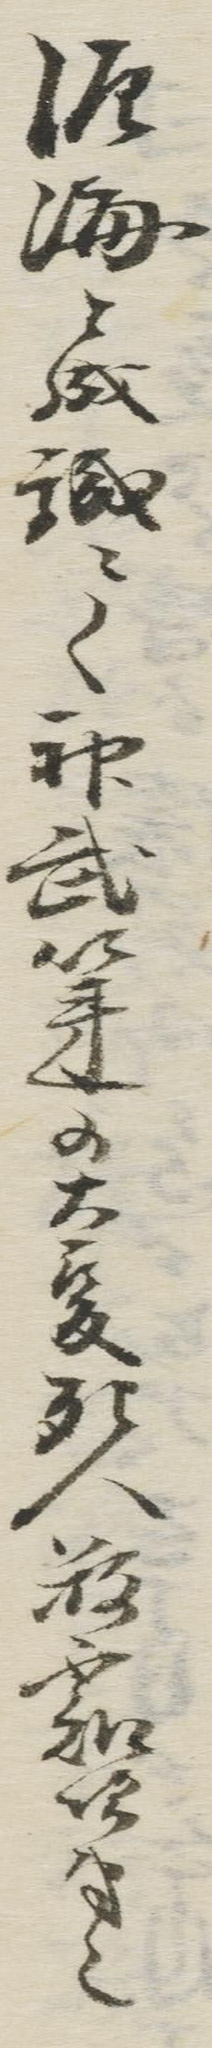泥海と成誠二〳〵神武以来の大変死人数不知次第也
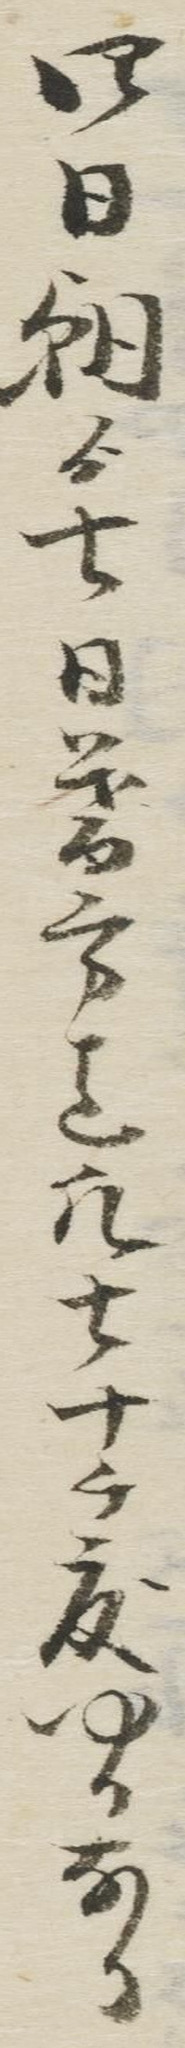四日朝ゟ七日暮方迄凡七十ケ度ゆりなり
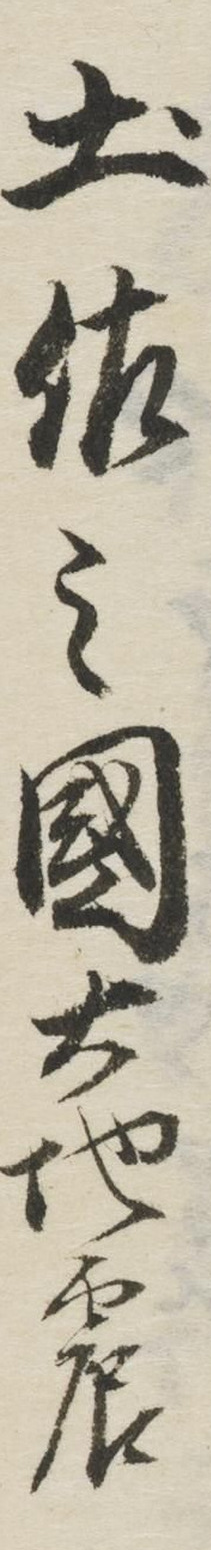土佐之国大地震
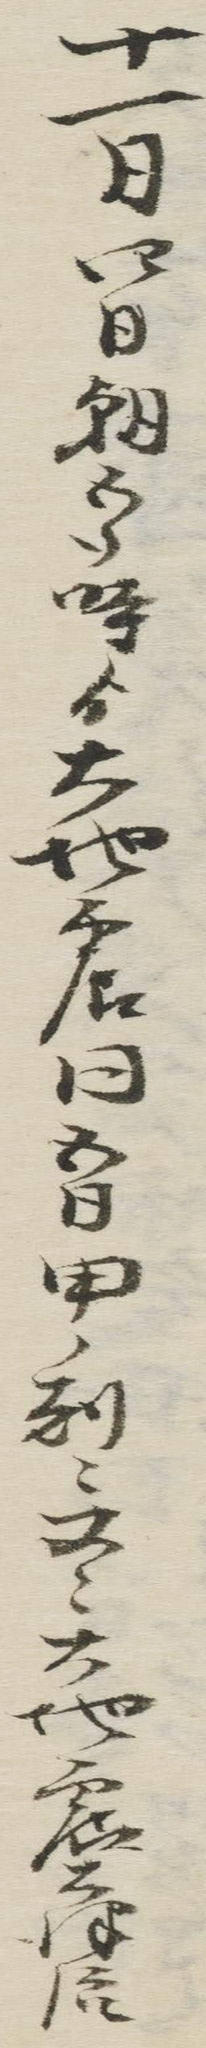十一月四日朝五ツ時ゟ大地震同五日申ノ刻ニ又々大地震大津浪
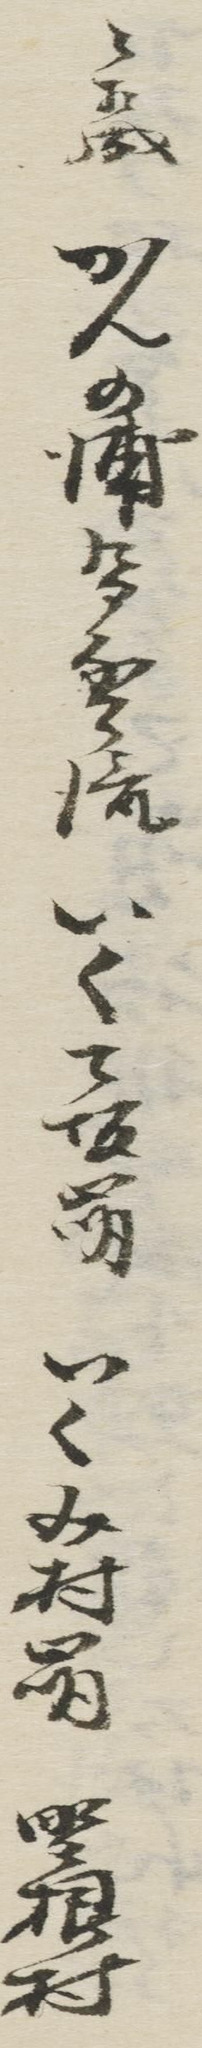二相成かんの浦九部通り流れいくて坂崩いくみ村崩野根村
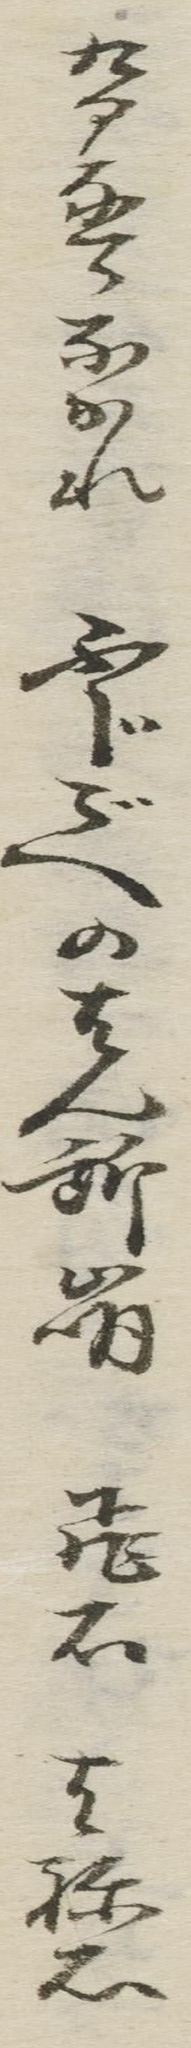九部通りながれふじごへのはん所崩飛石はね石

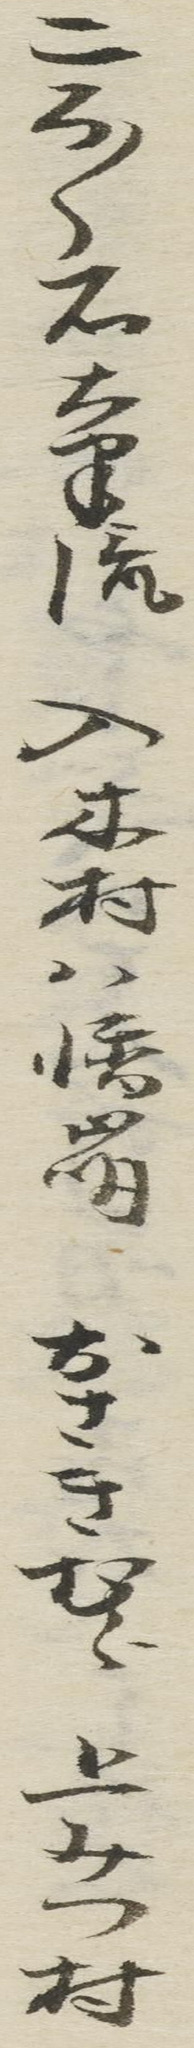ころ〳〵石大半流入木村八幡崩おさきむら上みつ村
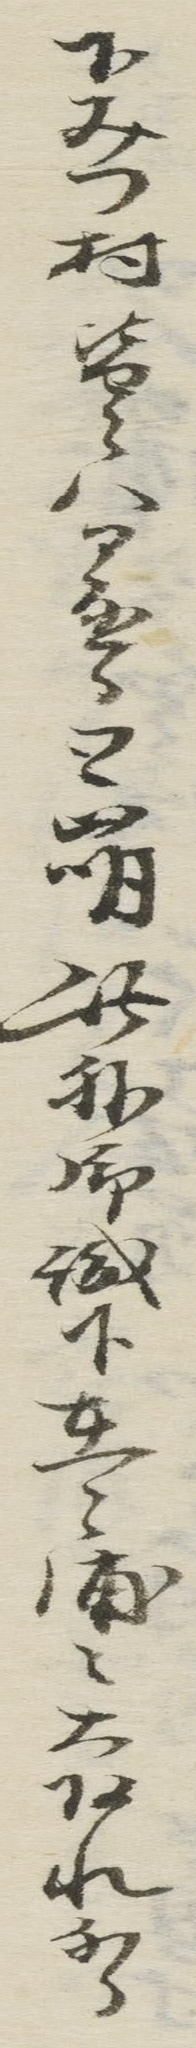下みつ村皆々八部通り以上崩此外御城下在々浦々大あれなり
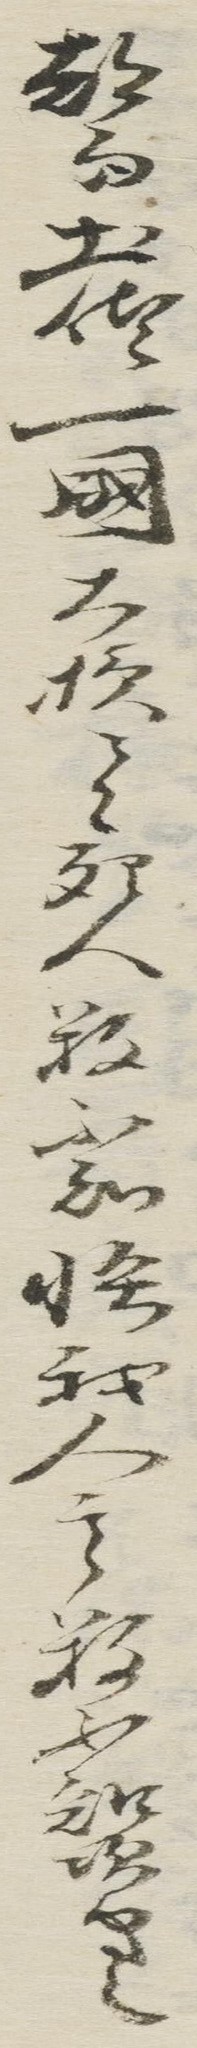都而土佐一国大損にて死人数不知怪我人其数不知次第也
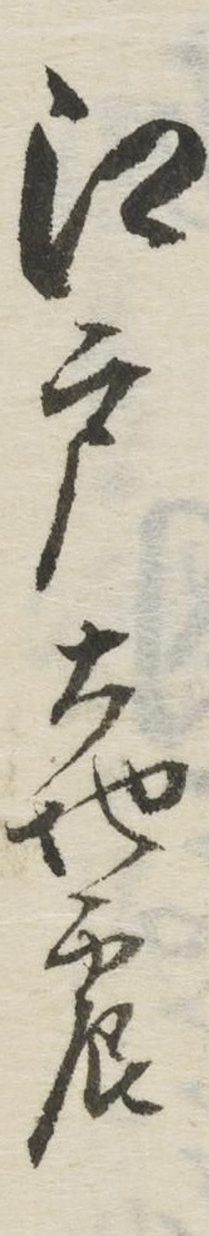江戸大地震
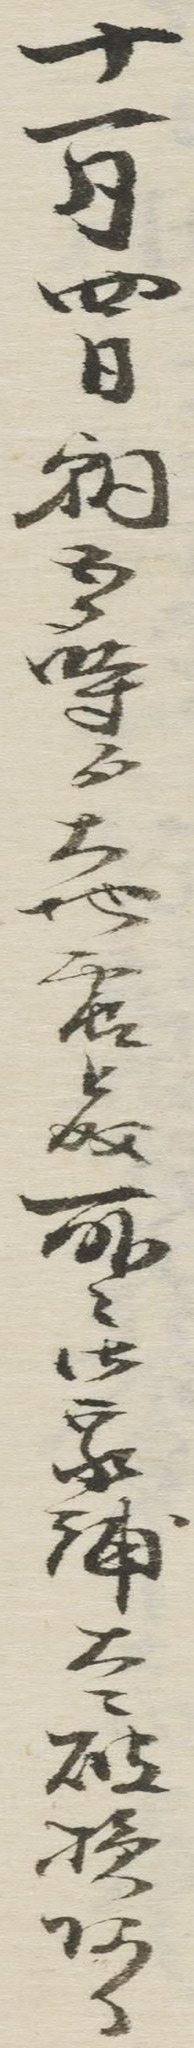十一月四日朝五ッ時ゟ大地震と成所々お屋鋪大ニ破損あり
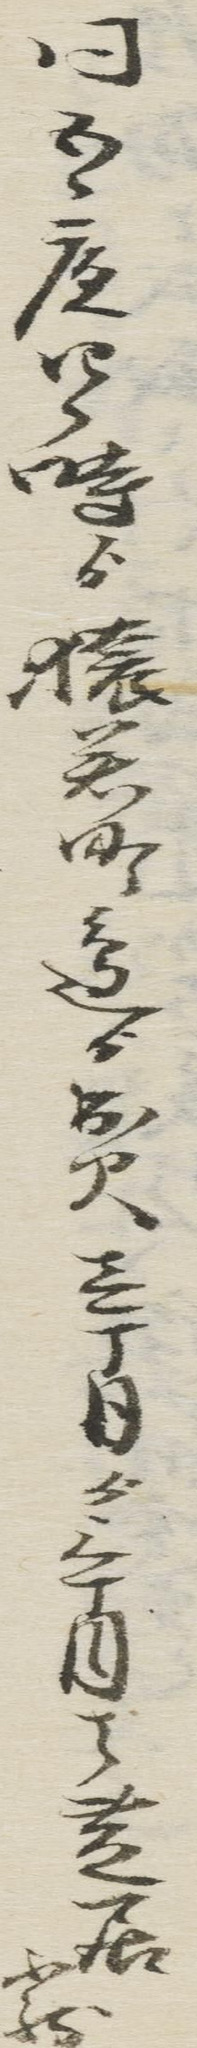同五日夜四ッ時ゟ猿若町辺ゟ出火壱丁目ゟ三丁目は芝居不残
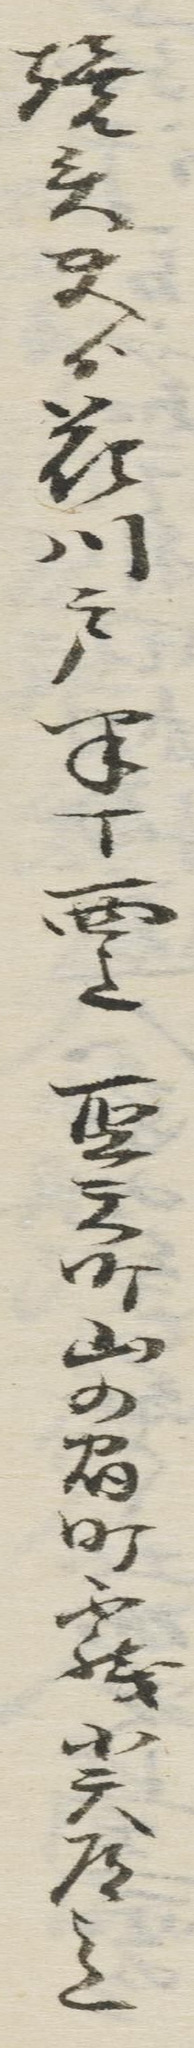焼失夫ゟ花川戸半丁西迄聖天町山の宿町不残小天道迄
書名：諸国大地震大津波一代記
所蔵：東京大学地震研究所図書室 Earthquake Research Institute Library, The University of Tokyo, JAPAN
